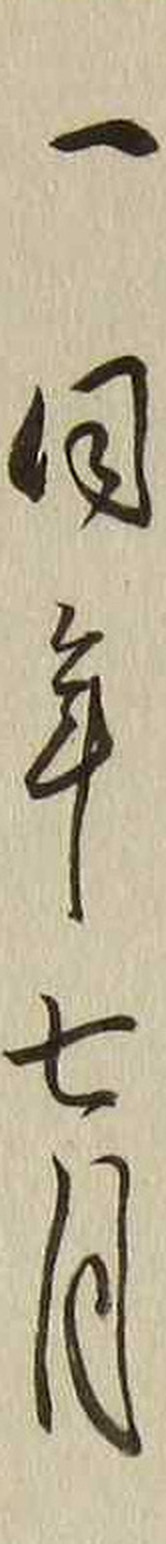一同年七月
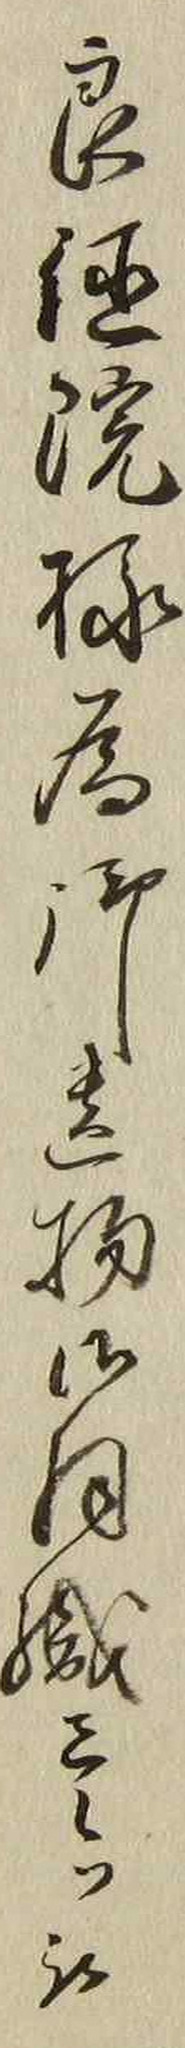良徳院様為御遺物御羽織参ツ被
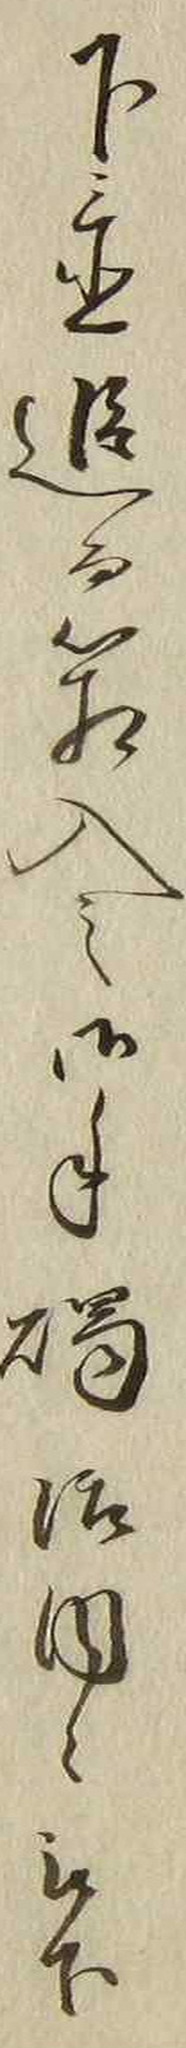下置追而箱入之御手燭御内々被下
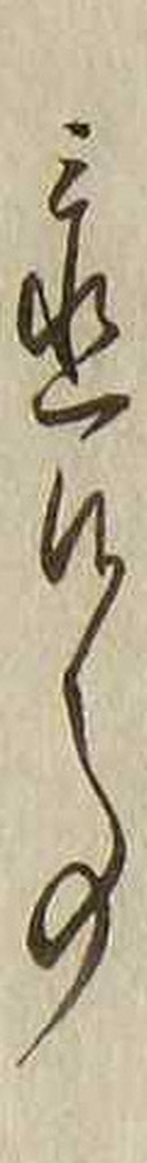置候事
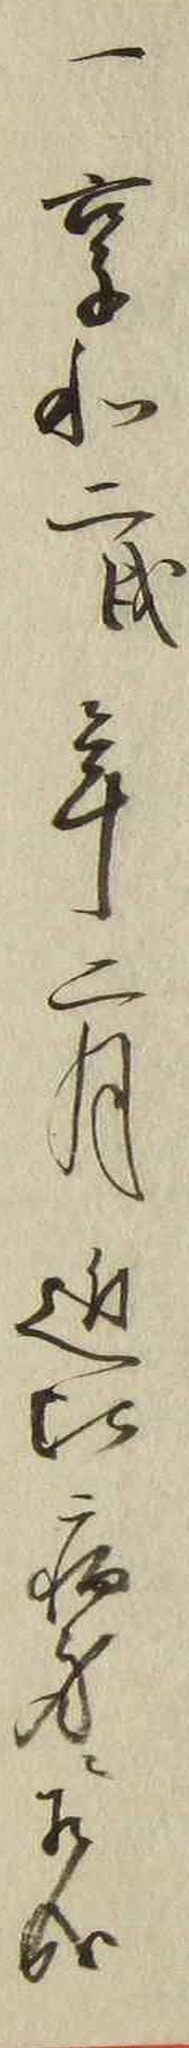一享和ニ戌年二月近比病身ニ相成

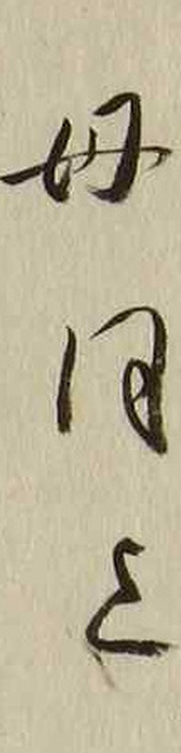母同上
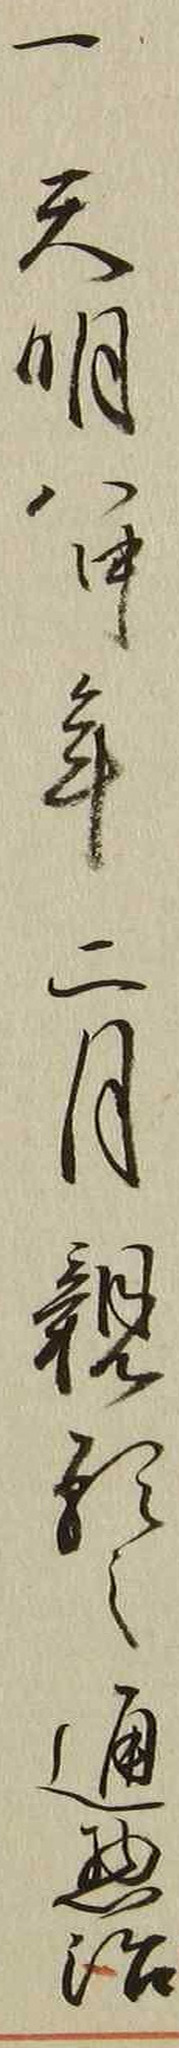一天明八申年二月親願之通惣浩
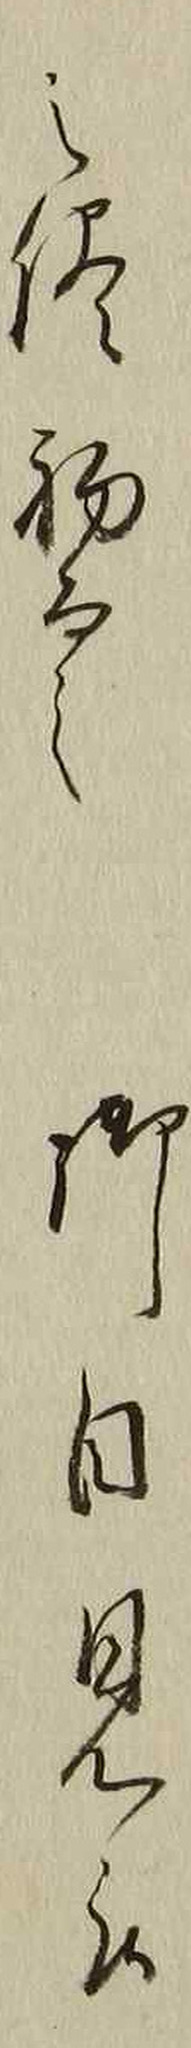之儘初而之御目見被
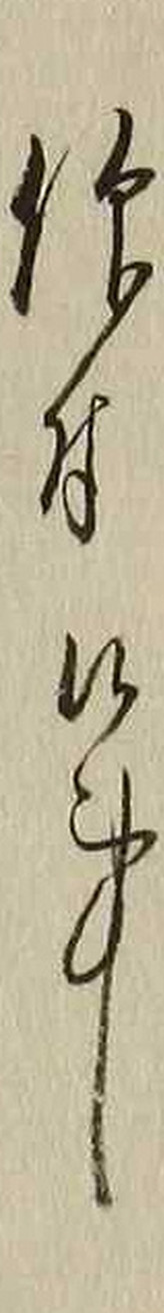仰付候事
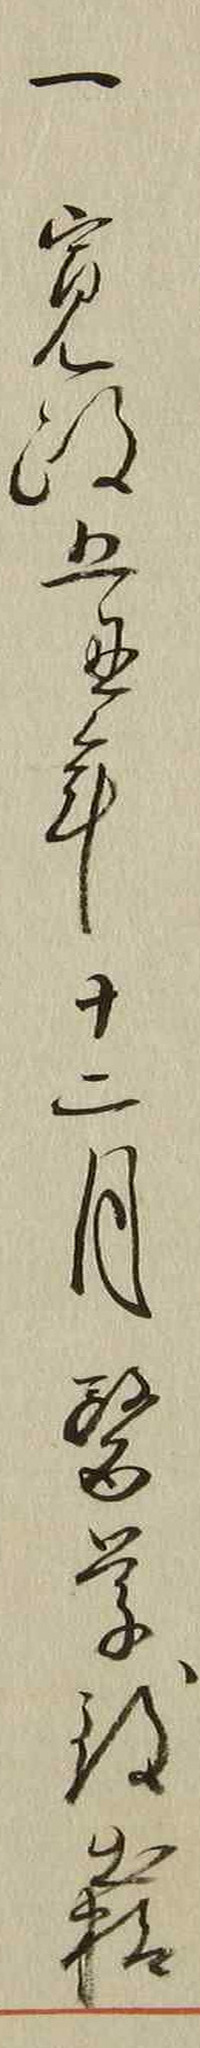一寛政五丑年十二月医学致出精
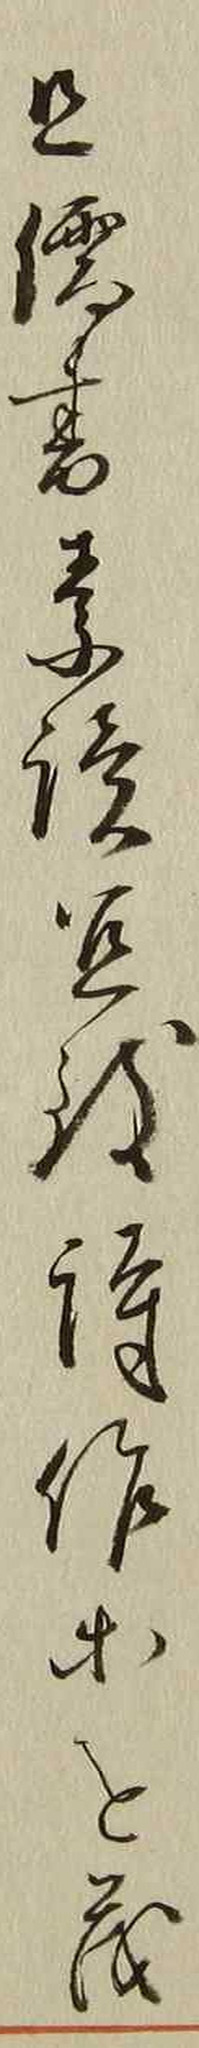且儒所素読宜致詩作等を茂
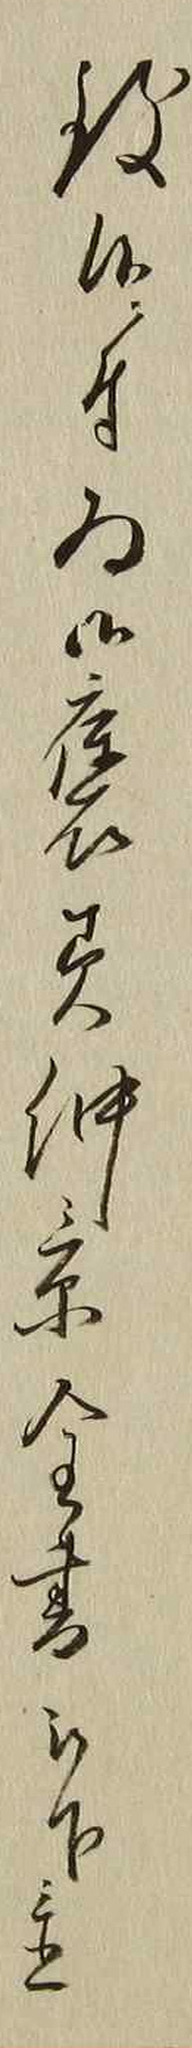致候ニ付為御褒美仲章全書被下置
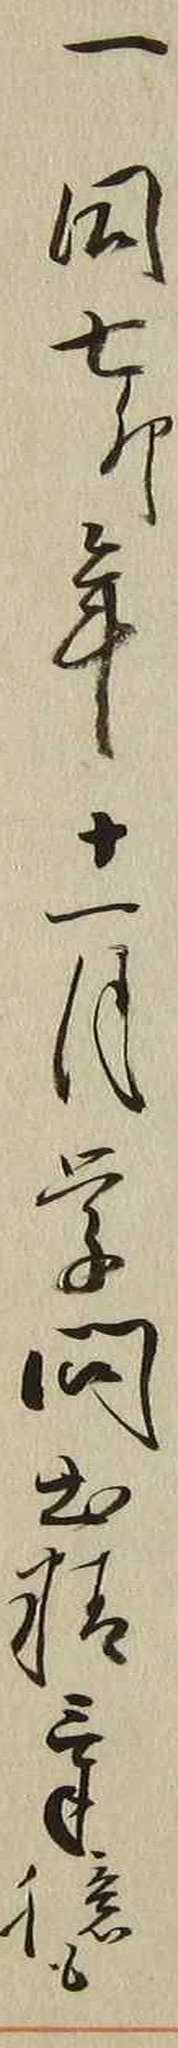一同七卯年十一月学問出精気憶も
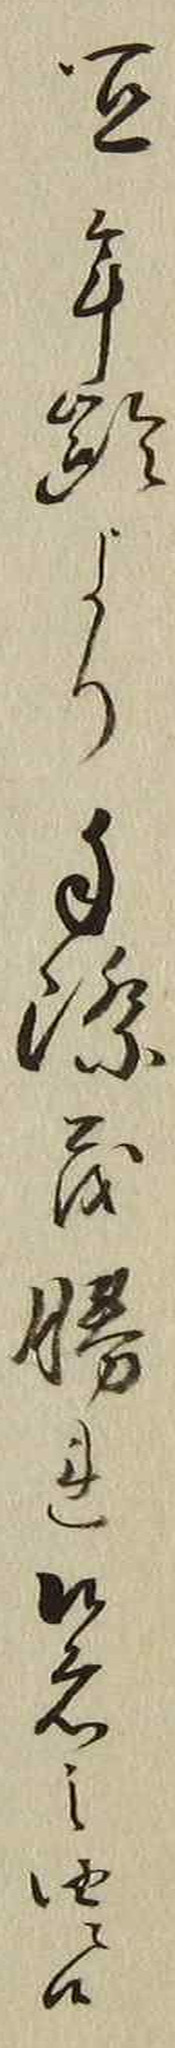宜年齢より手際茂勝れ候者之由ニ候
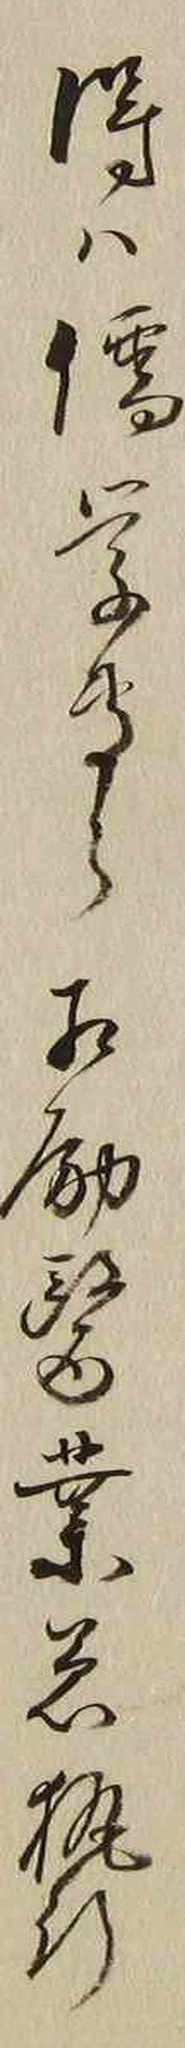得ハ儒学専ら相励医業兼執行
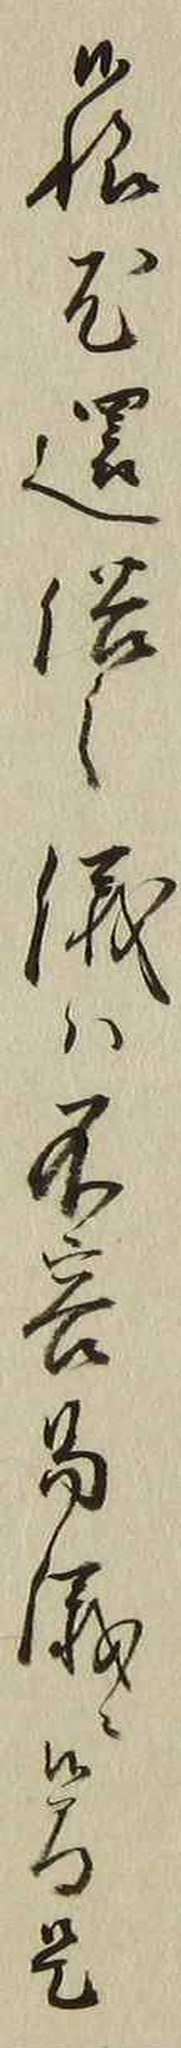候様尤還俗之儀ハ不容易儀ニ候間是
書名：諸士系譜　巻之68　を之部2
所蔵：会津若松市立会津図書館
